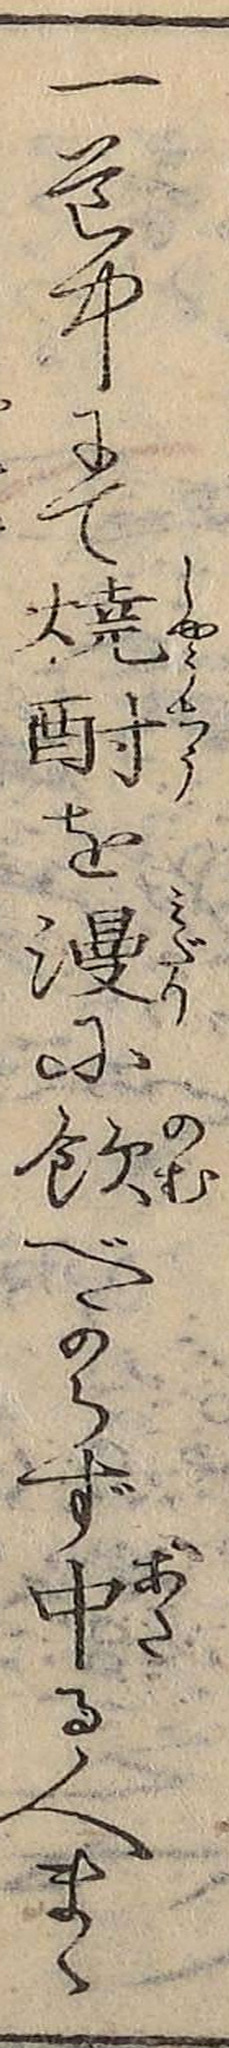一道中にて焼酎を漫に飲べからず中る人まゝ
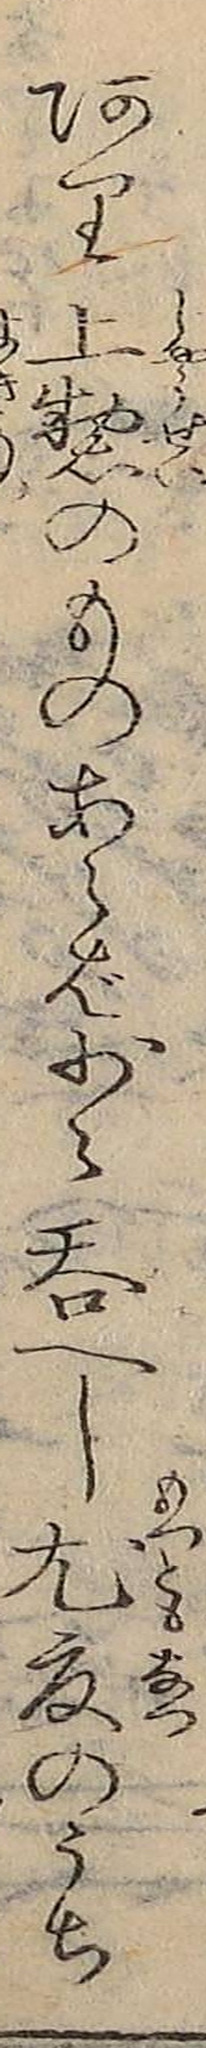あり上製のものあらば少々呑へし尤夏のうち
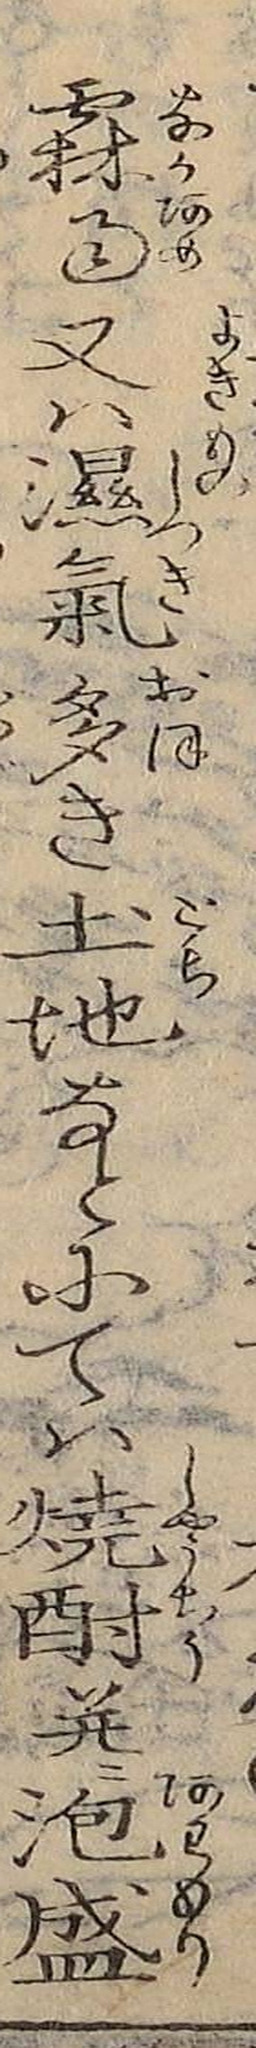霖雨又は湿気多き土地なとにては焼酎并泡盛
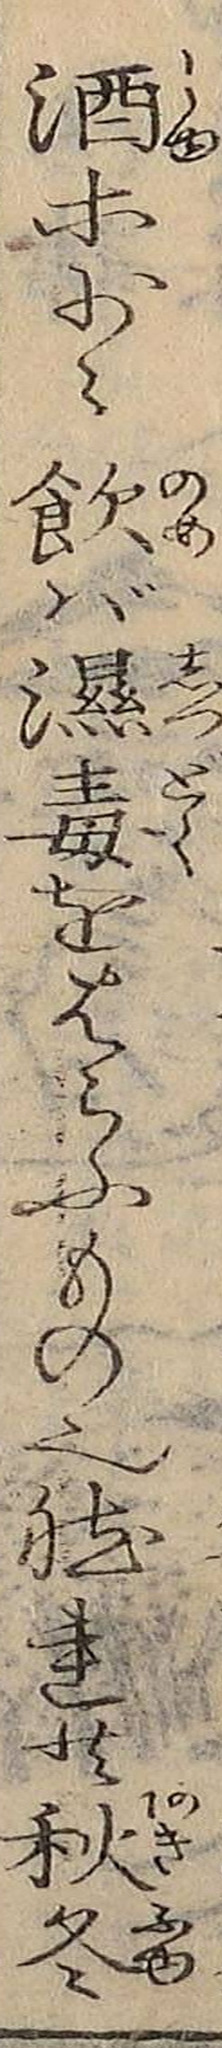酒等少々飲ば湿毒をはらふもの也然れ共秋冬
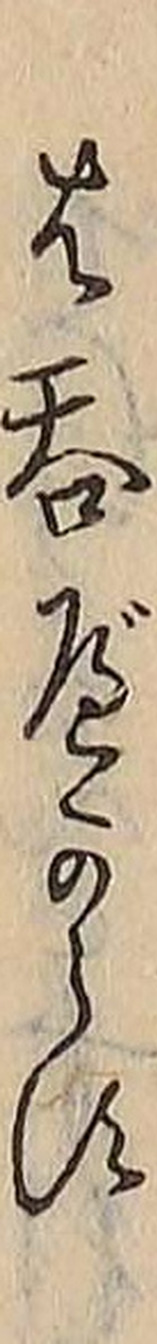は呑べからす
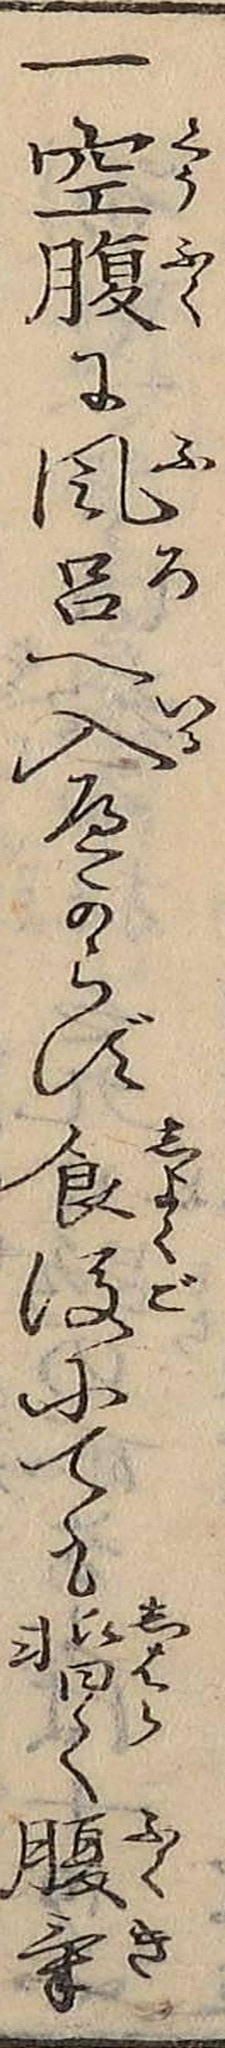一空腹に風呂へ入へからず食後にても暫く腹気
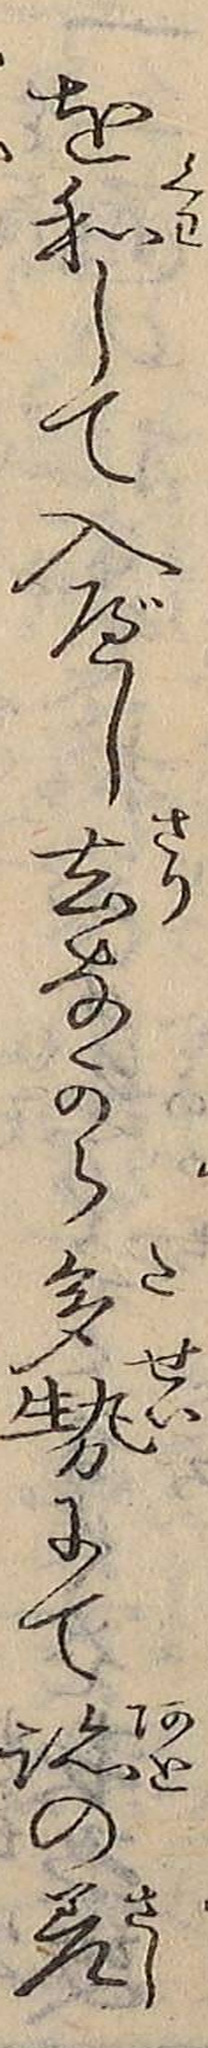を和して入べし去なから多勢にて跡の差
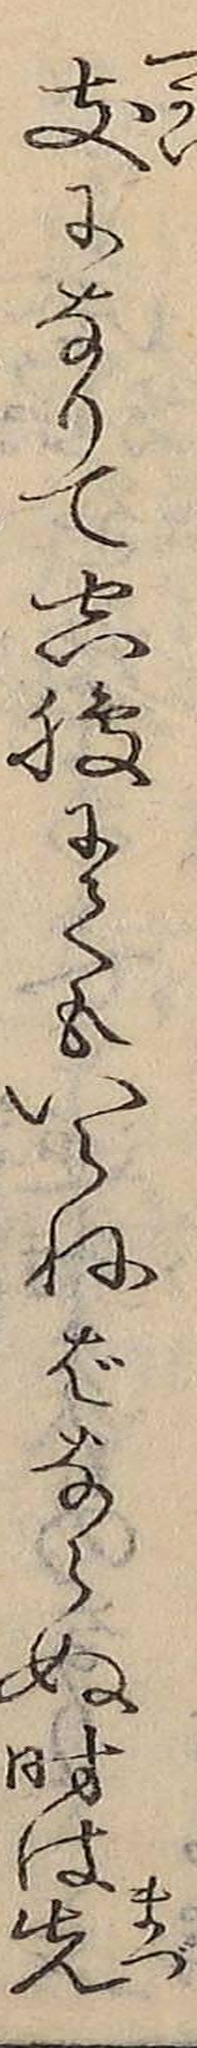支になりて空腹にてもいらねばならぬ時は先
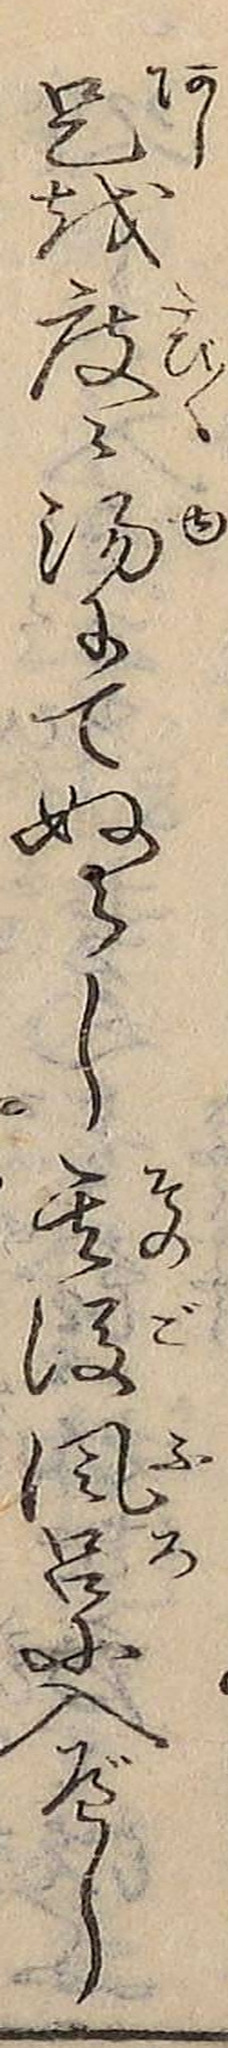足を度々湯にてぬらし其後風呂に入べし
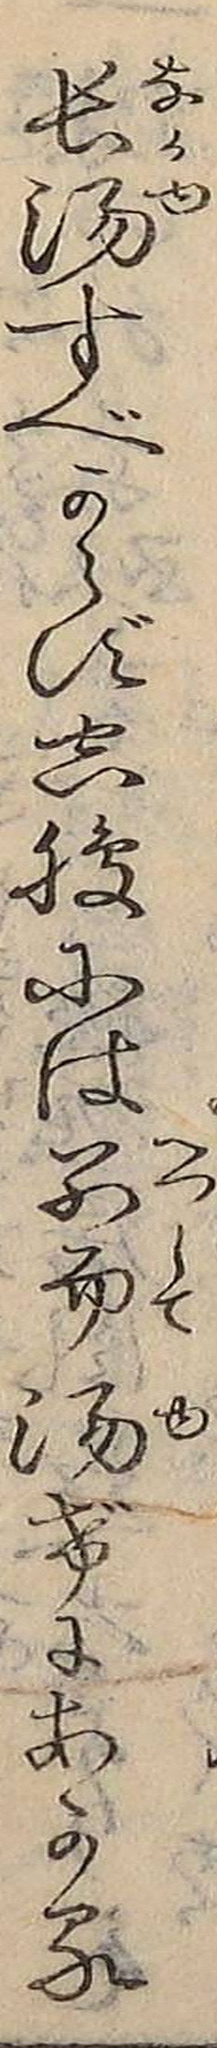長湯すべからず空腹には別而湯げにあかる
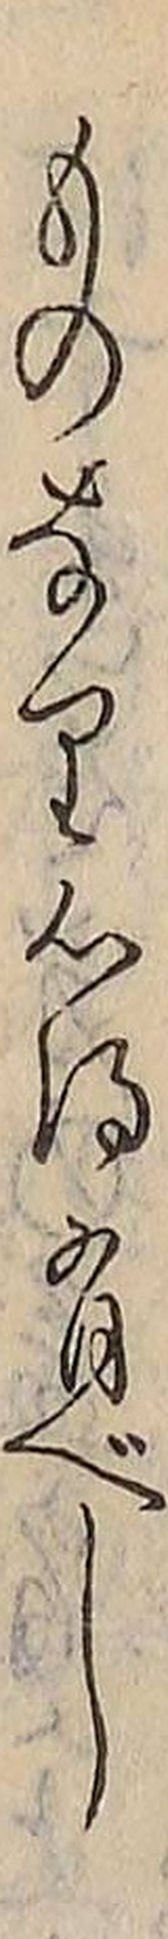ものなり心得有べし
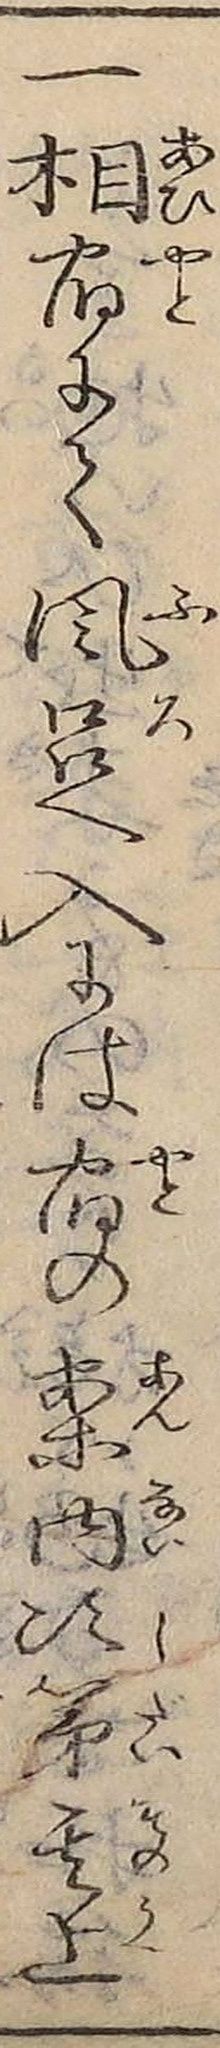一相宿にて風呂へ入には宿の案内次第其上
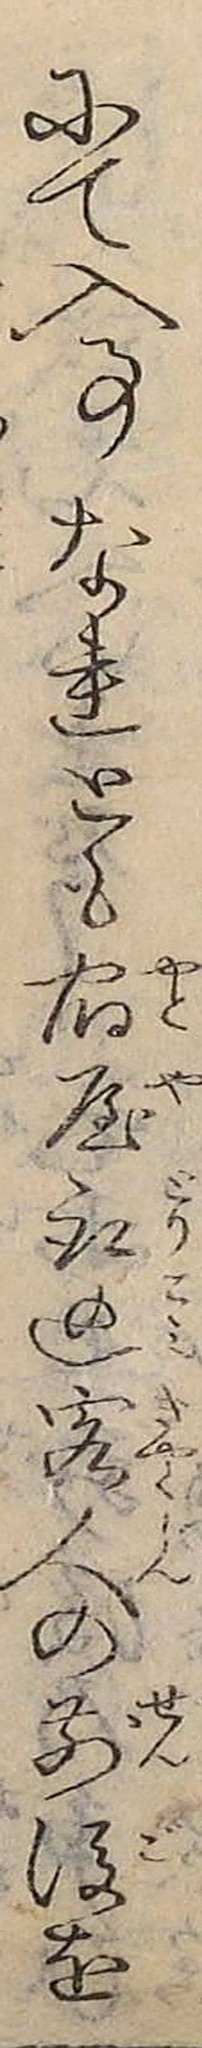にて入事なれとも宿屋取込客人の前後を
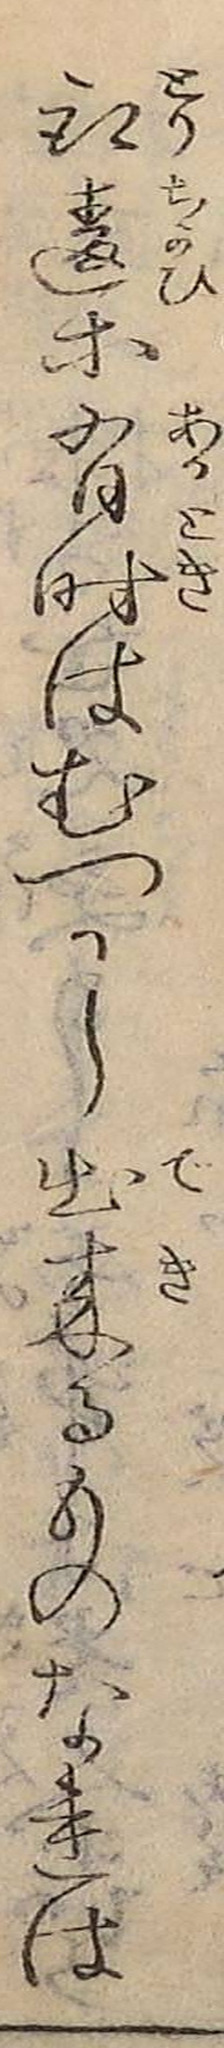取違等有時はむつかし出来るものなれは

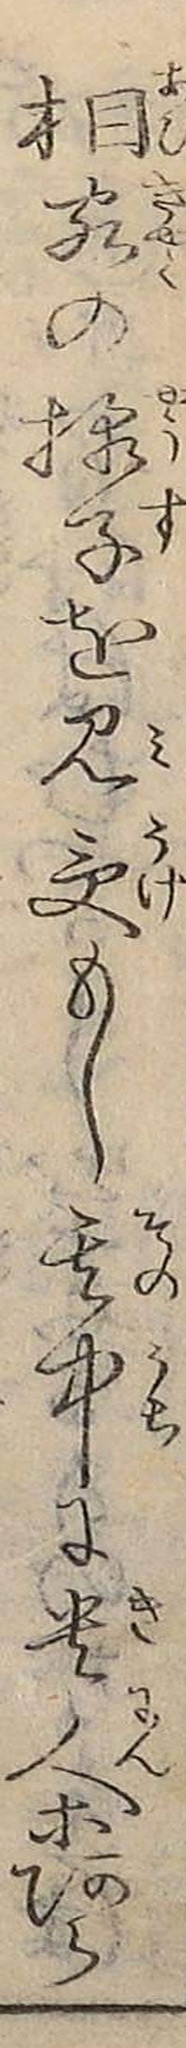相客の様子を見受もし其中に貴人等あら
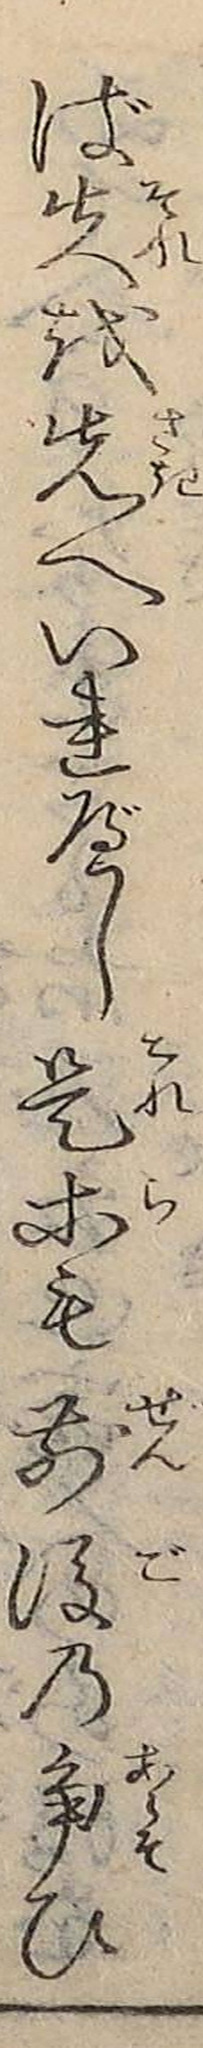ば先を先へいれべし是等も前後の争ひ
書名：旅行用心集
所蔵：神戸大学附属図書館 国文学研究資料館
